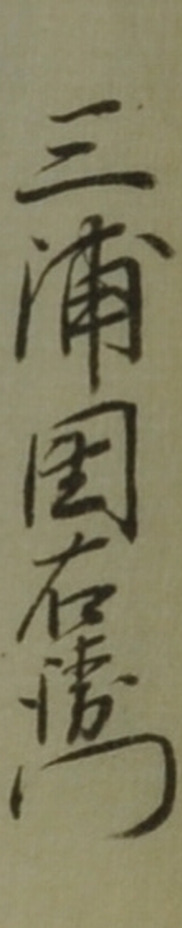三浦団右衛門
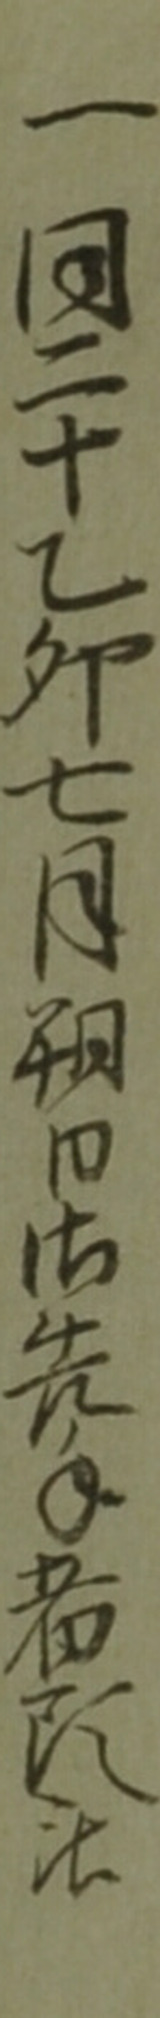一同二十乙卯七月朔日御先手者頭被
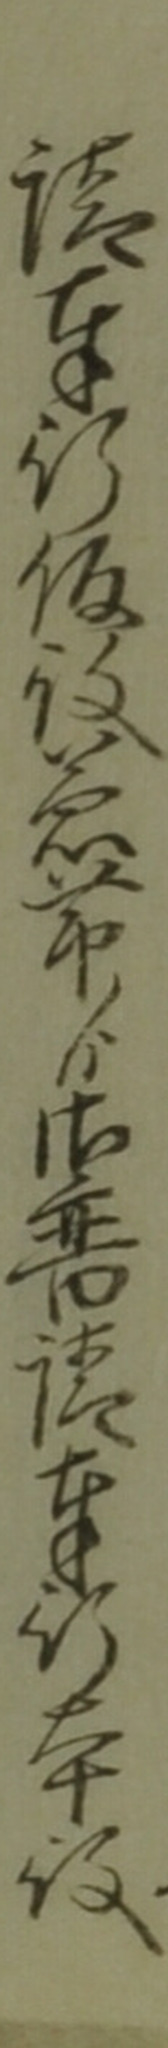請奉行仮役兼帯ゟ御普請奉行本役
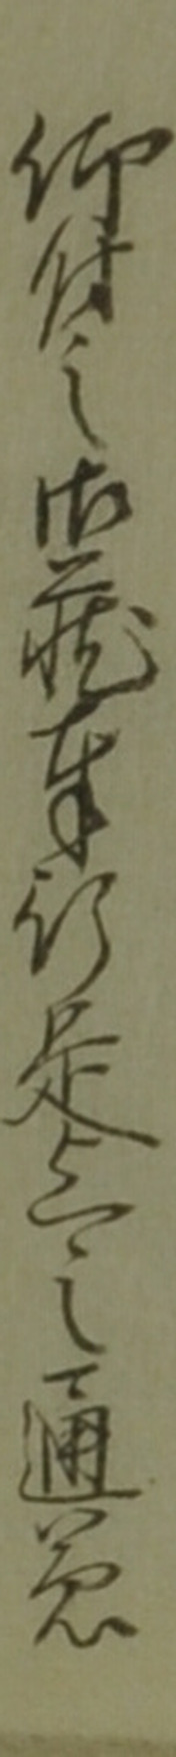被仰付之御蔵奉行是迄之通兼
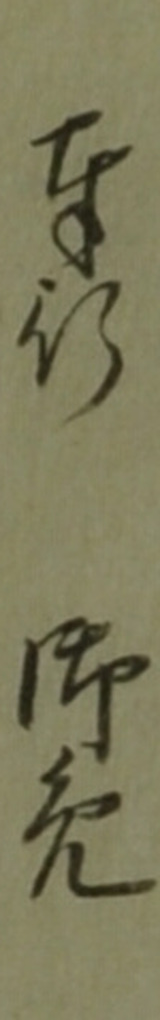奉行御免
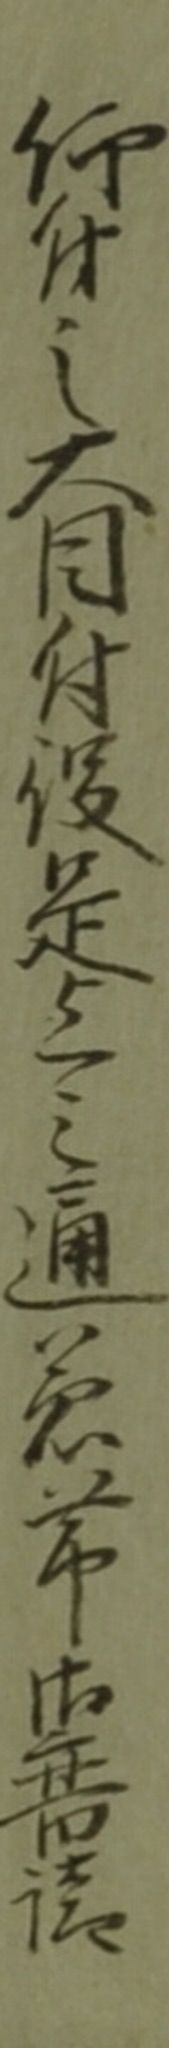仰付之大目付役是迄之通兼帯御普請
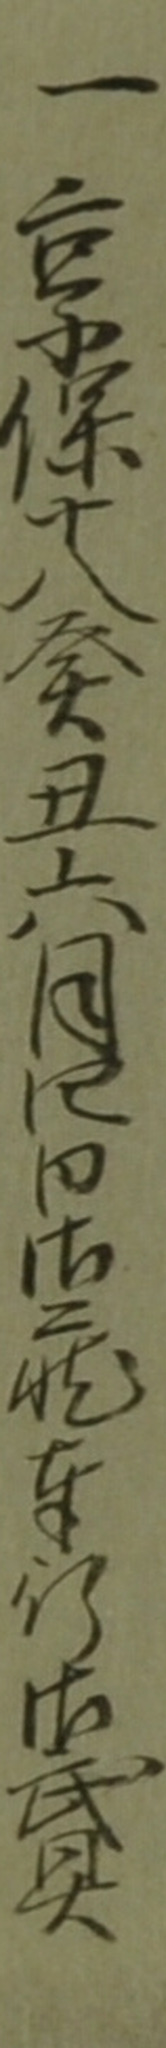一享保十八癸丑六月四日御蔵奉行御武具
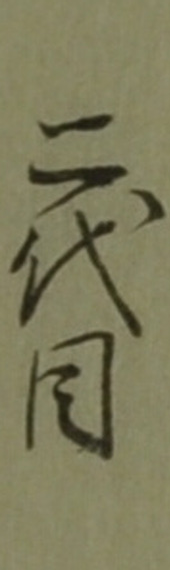二代目
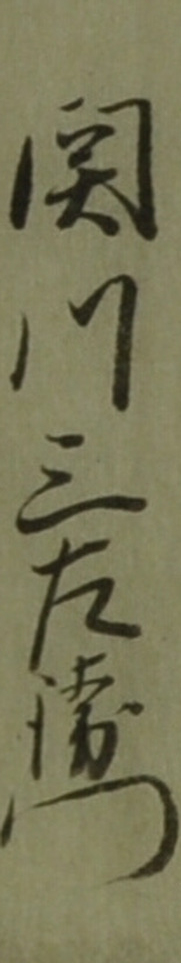関川三左衛門
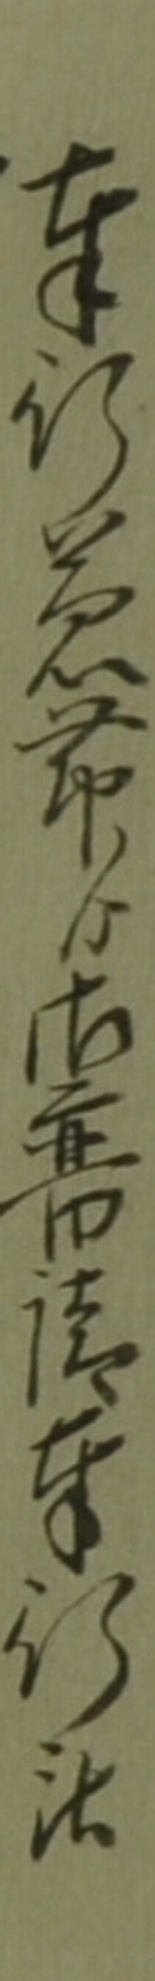奉行兼帯ゟ御普請奉行被
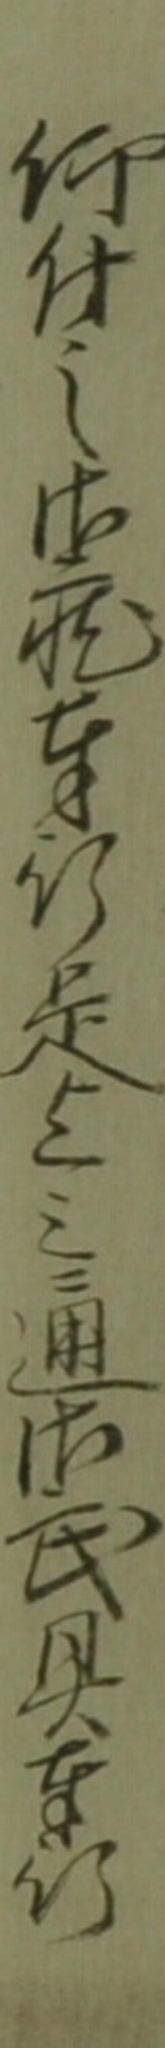仰付之御蔵奉行是迄之通御武具奉行

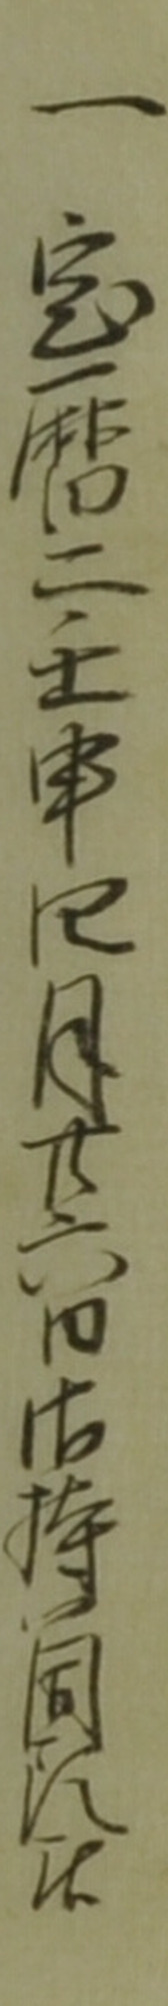一宝暦二壬申四月廿六日御持筒頭被
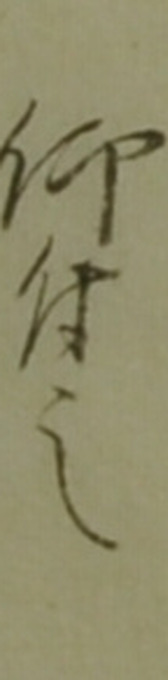仰付之
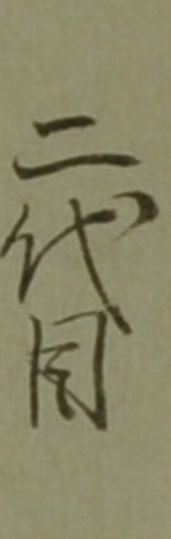二代目
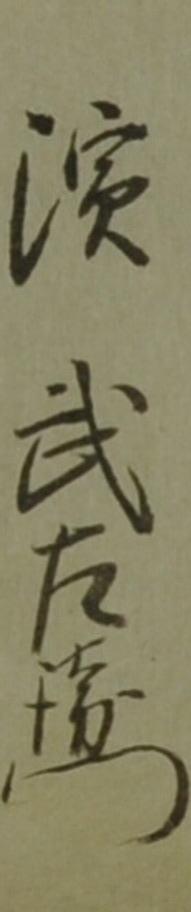濱武左衛門
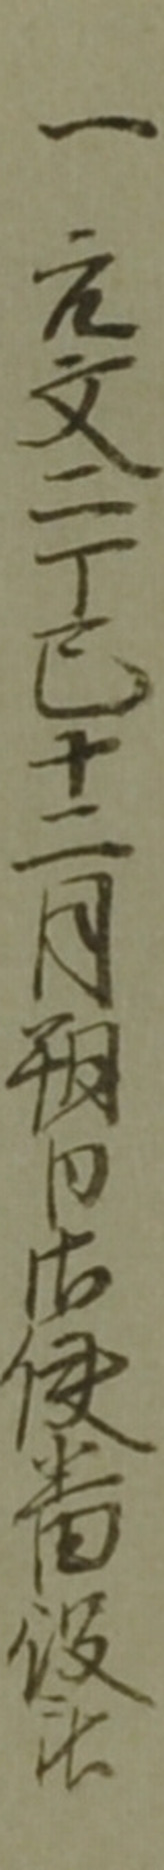一元文二丁巳十二月朔日御使番役被
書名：諸御役代々録（六）
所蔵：伊那市立高遠町図書館・合同会社AMANE
